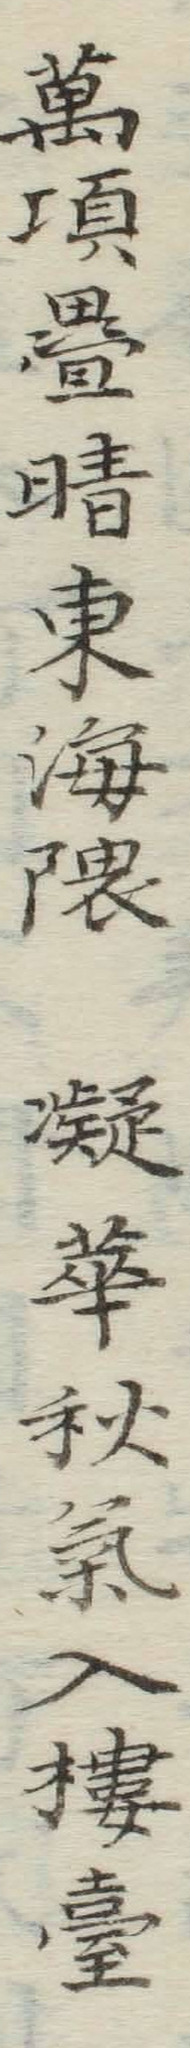万項畳晴東海隈凝萃秋気入楼台
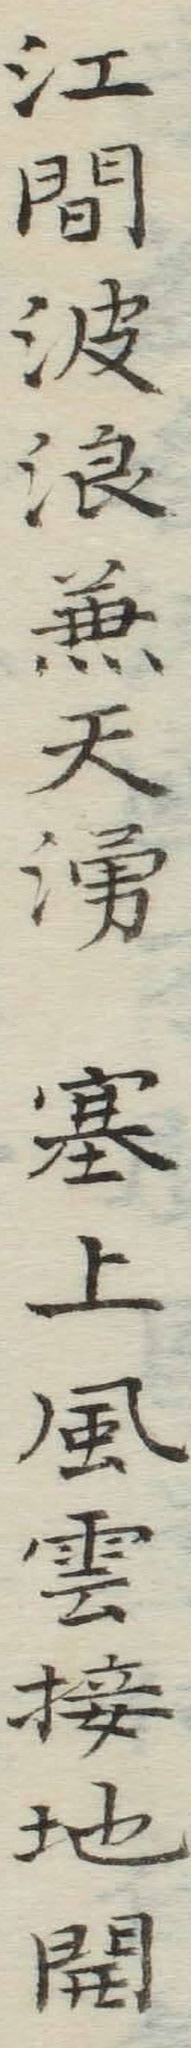江間波浪兼天湧塞上風雲接地開
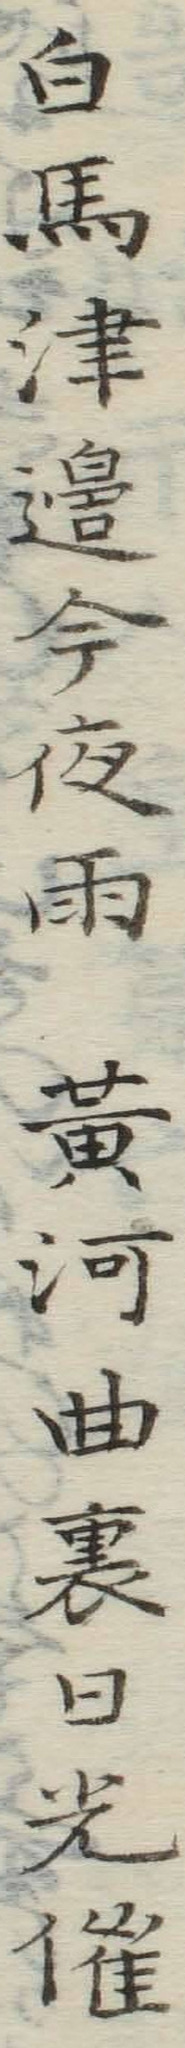白馬津邉今夜雨黄河曲裏日光催
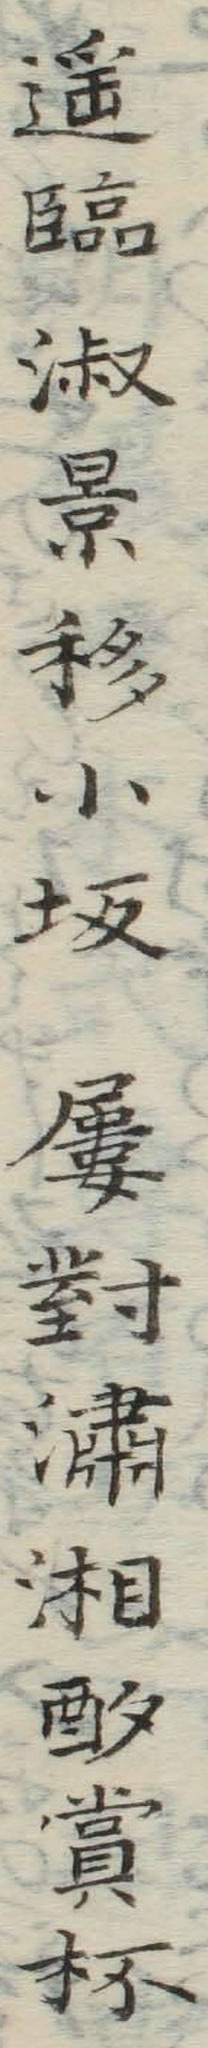遥臨淑景移小坂屢対潚湘酌賞杯
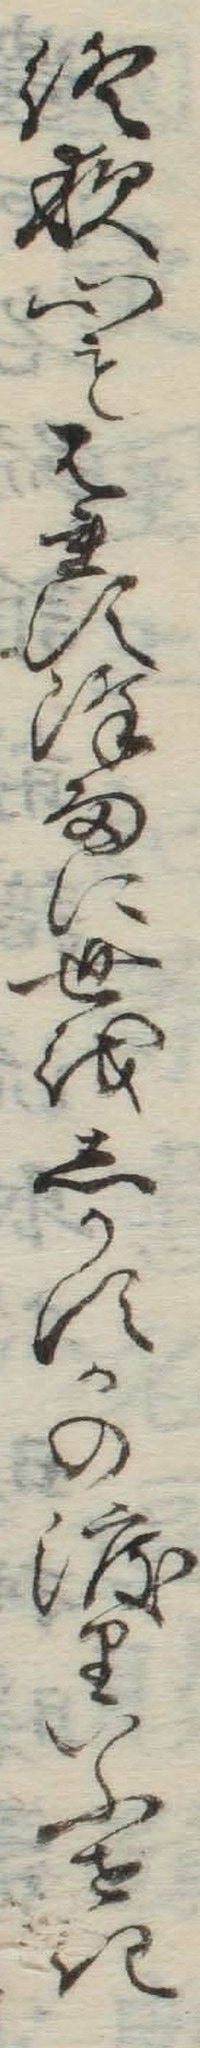終夜心もはれす降雨に世をしかすかの渡りいふせき
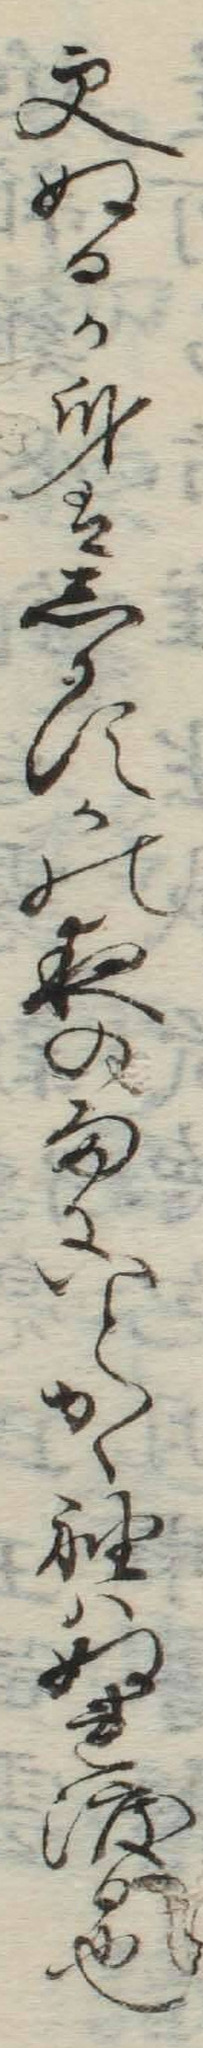更ぬるか身はしかすかの夜の雨にいとかゝ袖はぬれ渡る也

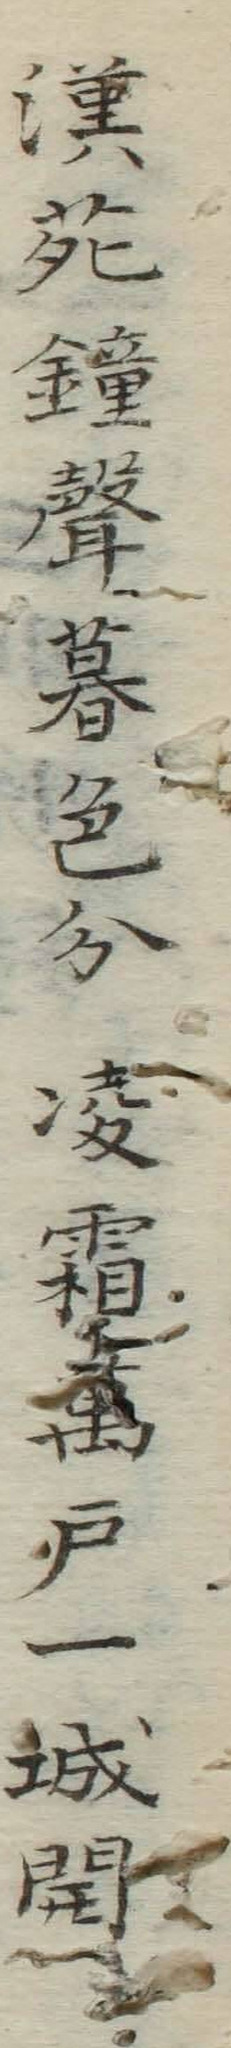漢苑鐘声暮色分凌霜万戸一城開
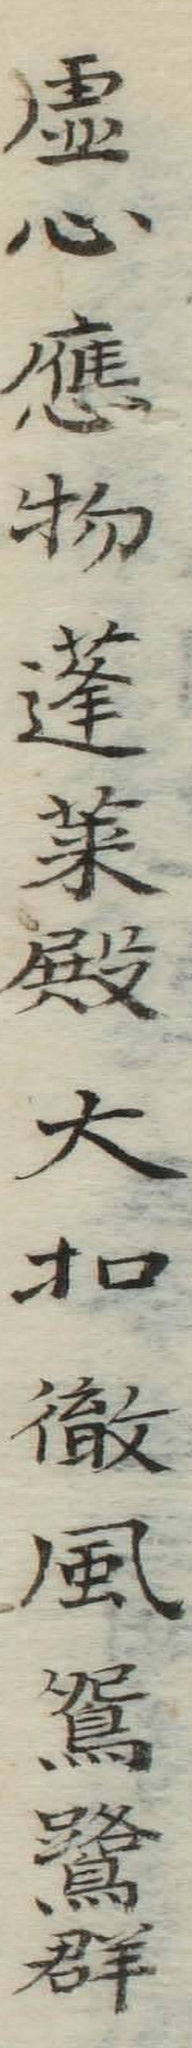虚心應物蓬莱殿大扣徹風鴛鷺群
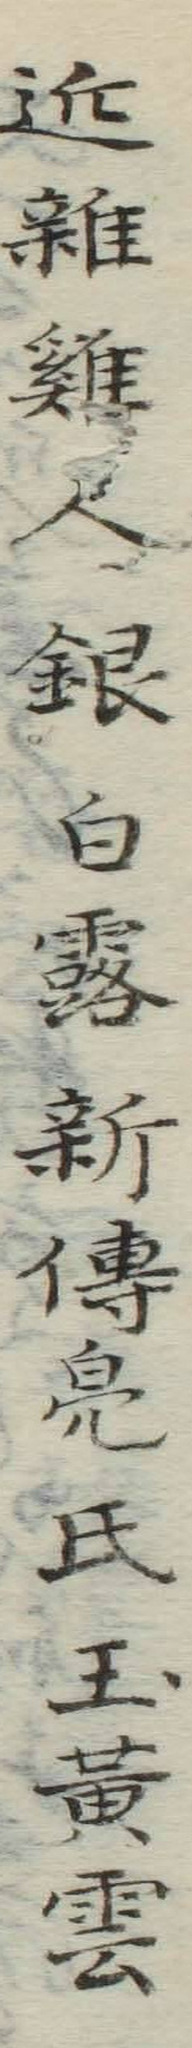近雑雞人銀白露新伝氏玉黄雲
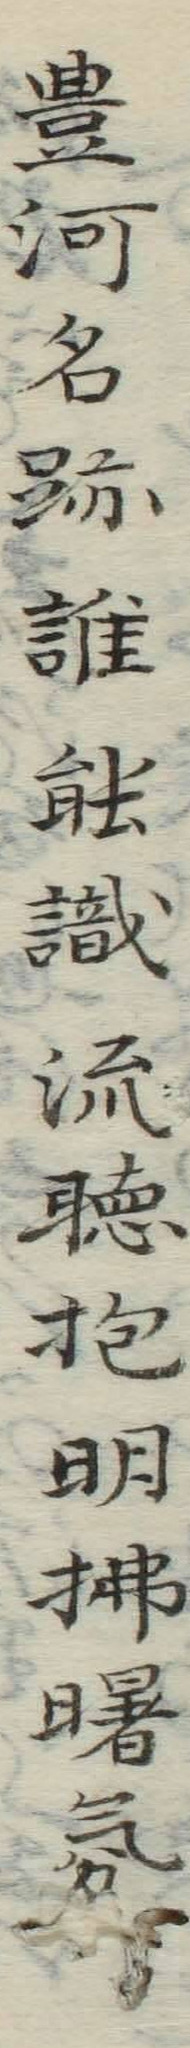豊河名跡誰能識流聴抱明拂曙気
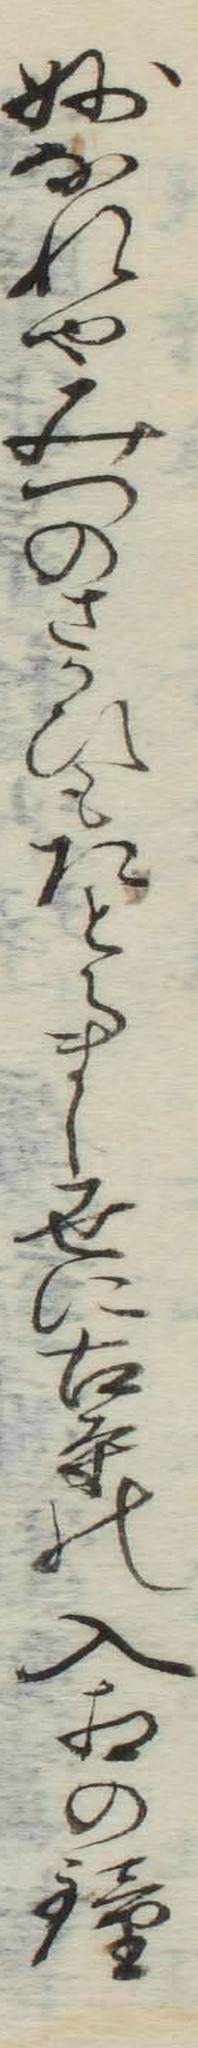妙なれやみつのさかひもたとらまし世に古寺の入相の鐘
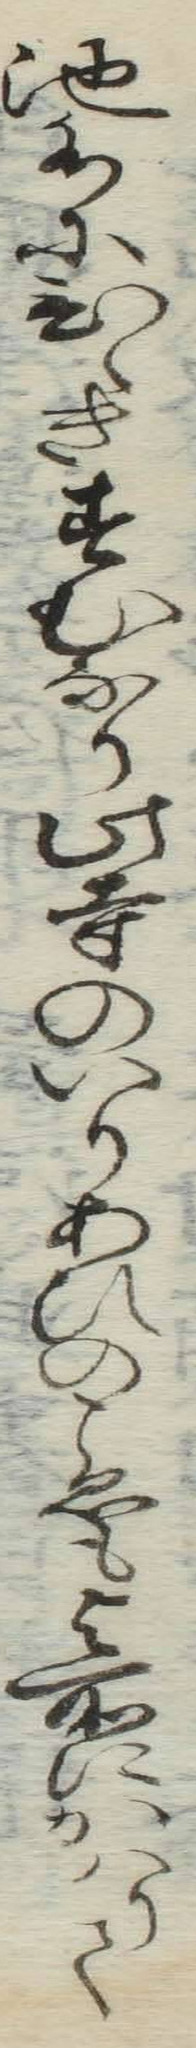池水にひらきすむなり此寺のいりあひのこゑも与所にかはりて
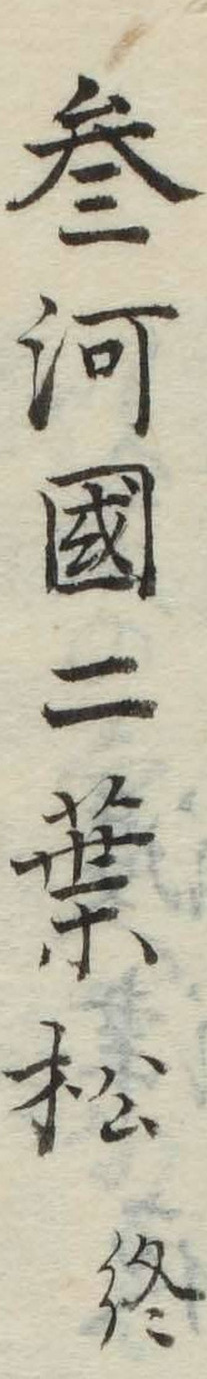参河国二葉松終
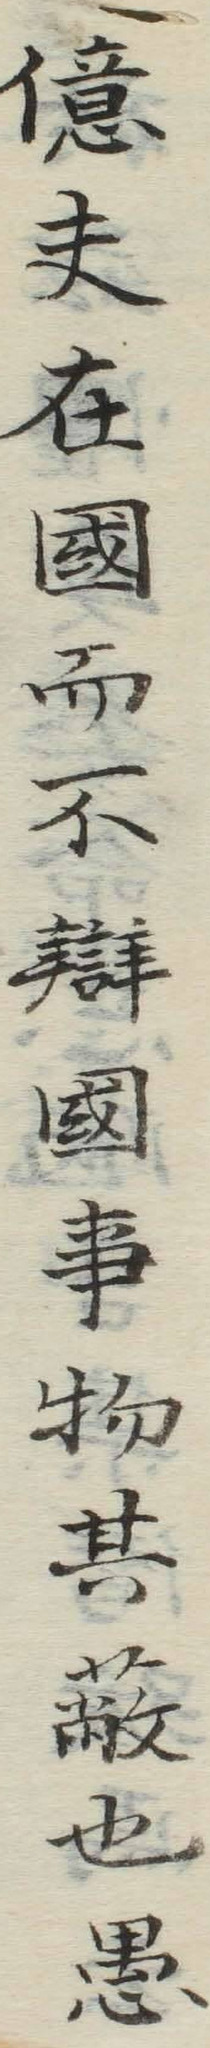億夫在国而不弁国事物其蔽也愚
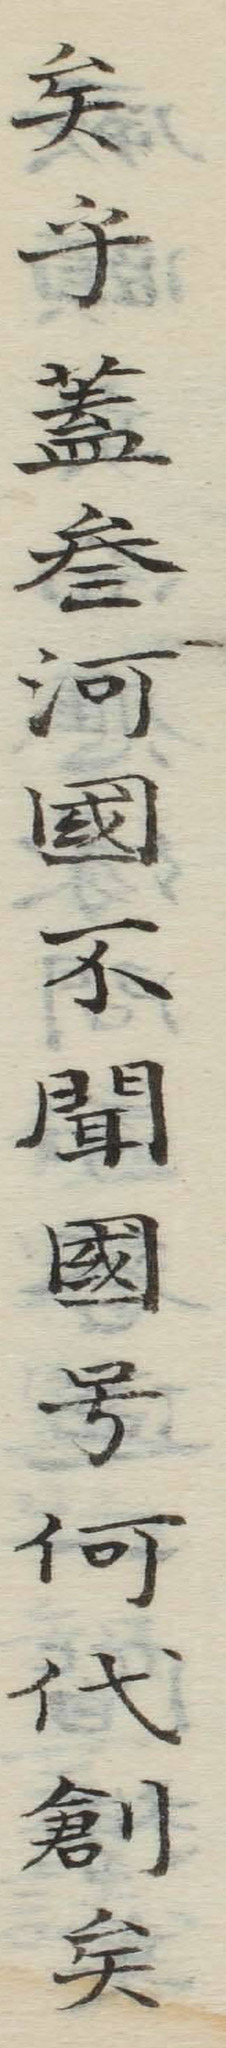矣乎蓋参河国不聞国号何代創矣
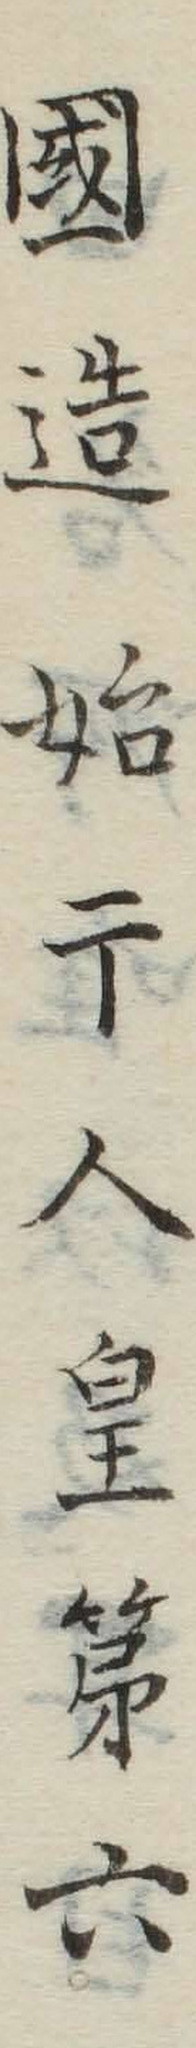国造始于人皇第六
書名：三河国二葉松
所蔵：国文学研究資料館
